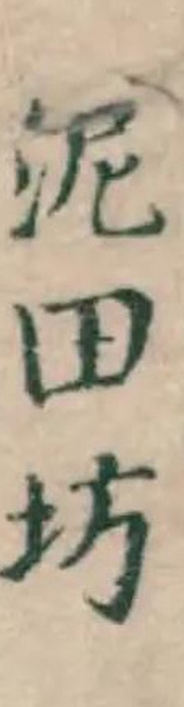泥田坊
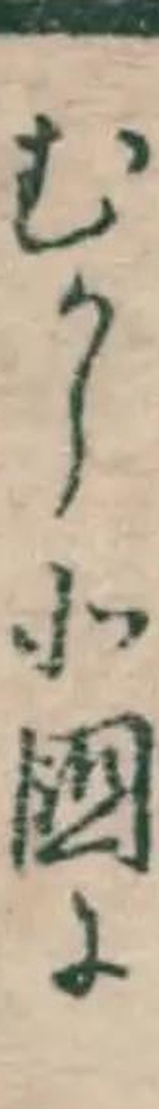むかし北国に
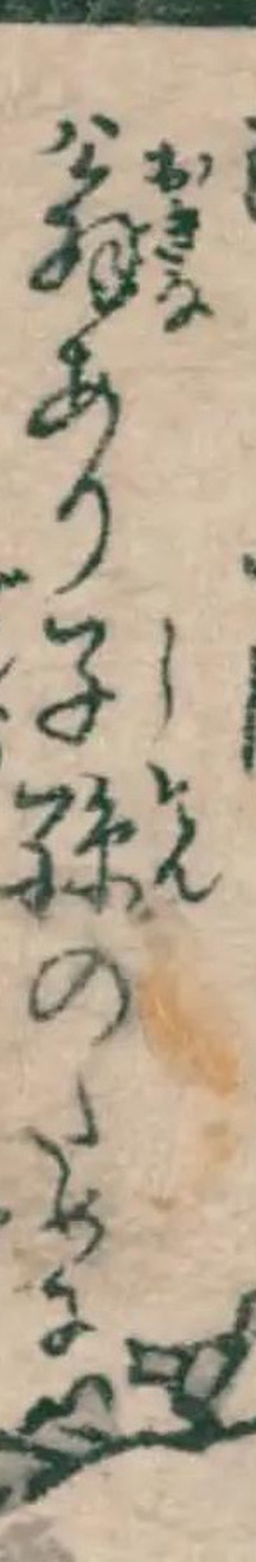翁あり子孫のために
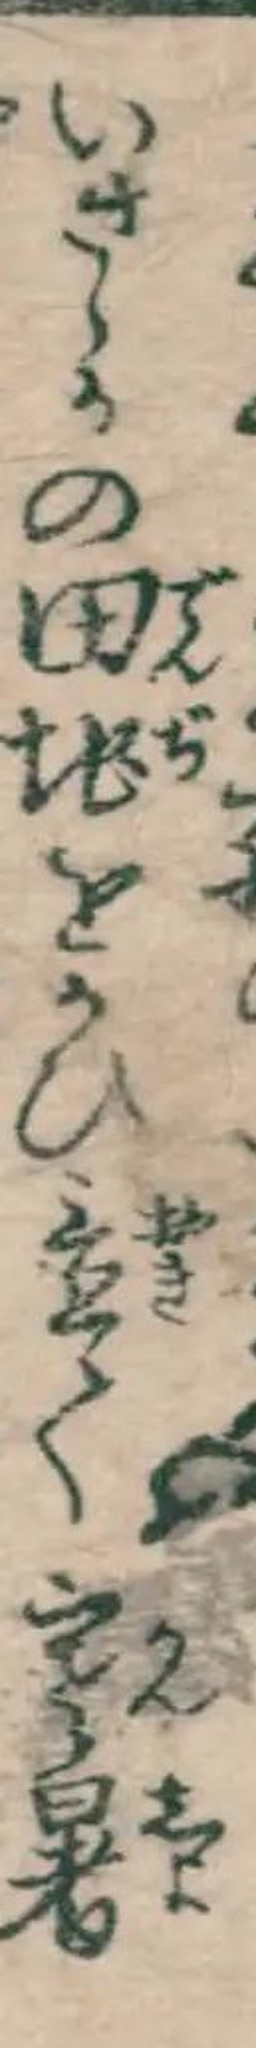いさゝかの田地をかひ置て寒暑
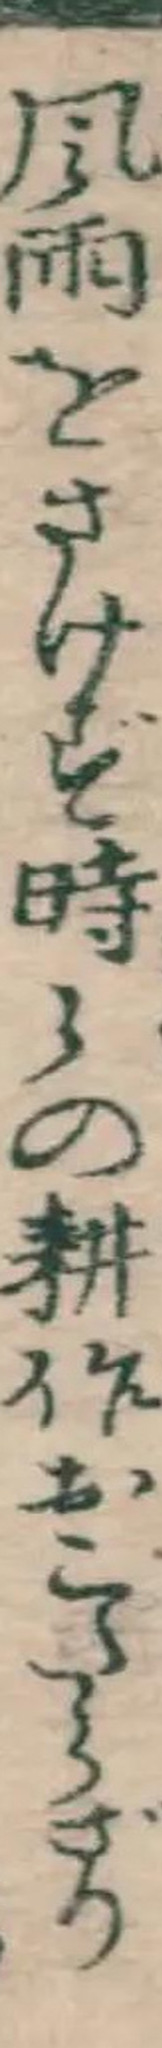風雨をさけず時々の耕作おこたらざり
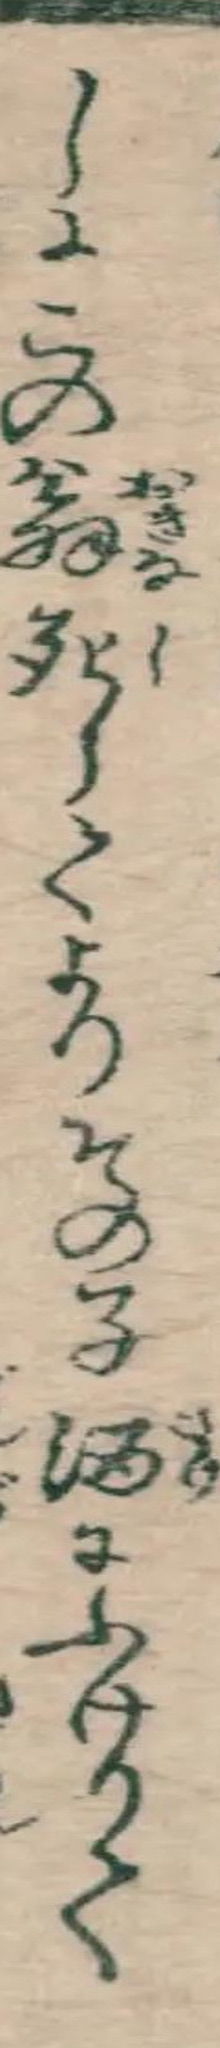しにこの翁死してよりその子酒にふけりて
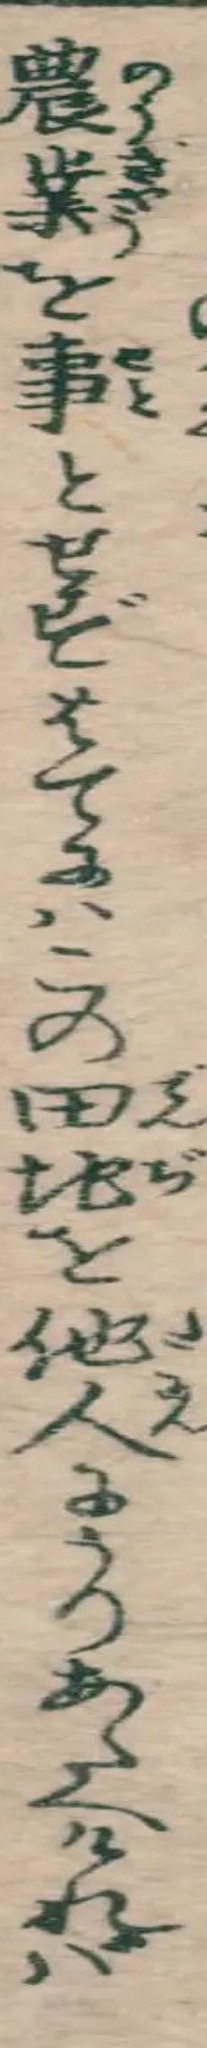農業を事とせずはてにはこの田地を他人にうりあたへければ
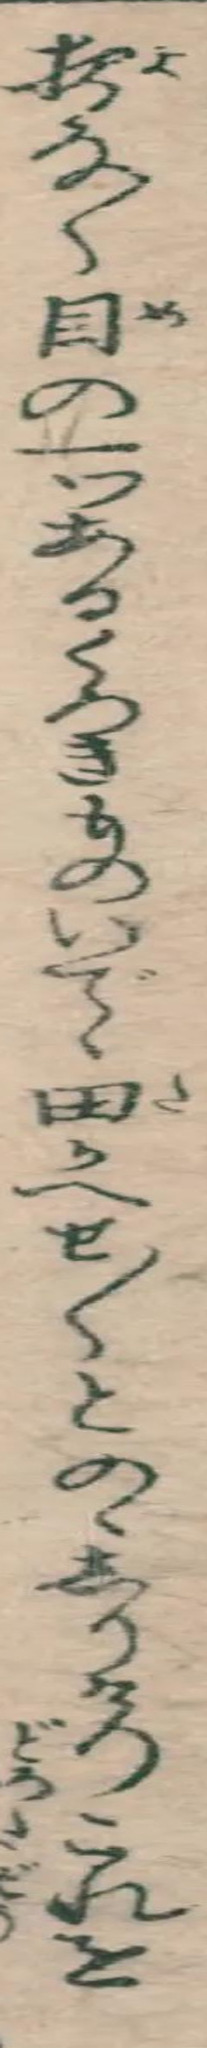夜な〳〵目の一つあるくろきものいでゝ田かへせ〳〵とのゝしりけりこれを
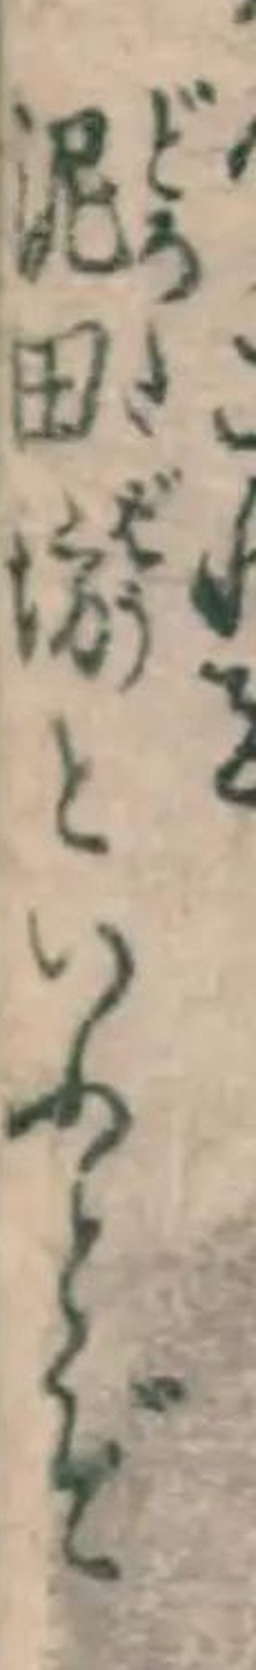泥田坊といふとぞ
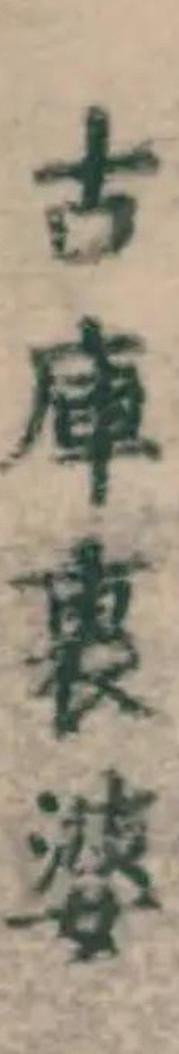古庫裏婆
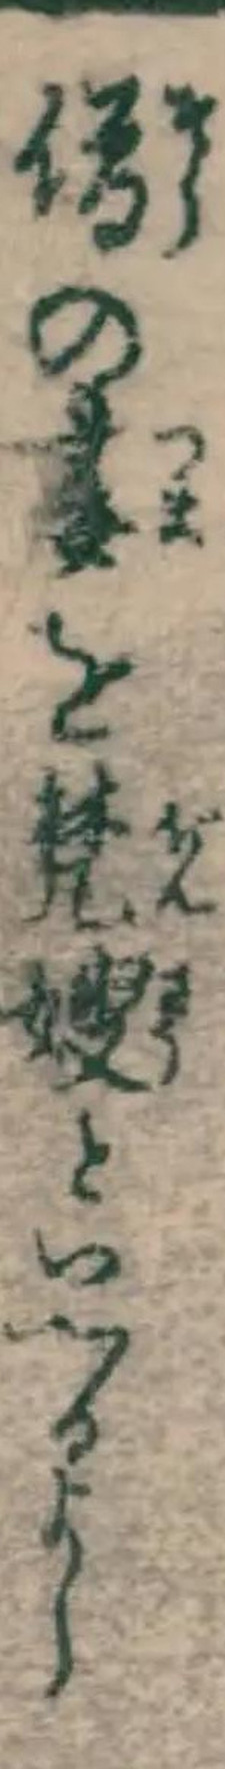僧の妻を梵嫂といへるよし
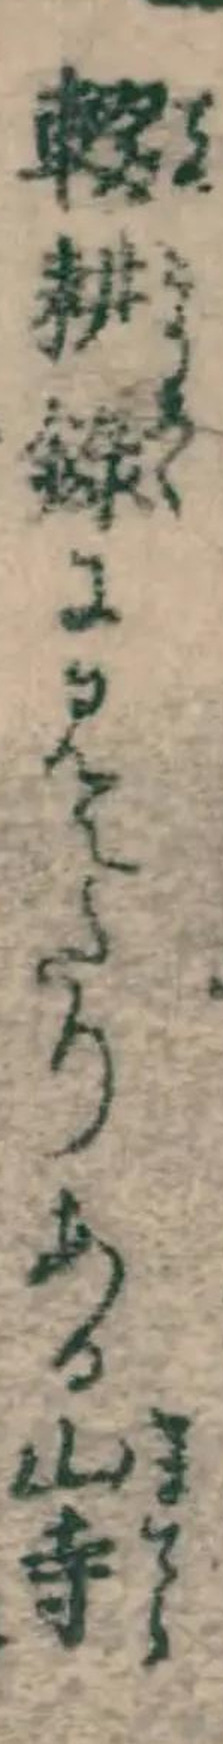輟耕録に見えたりある山寺
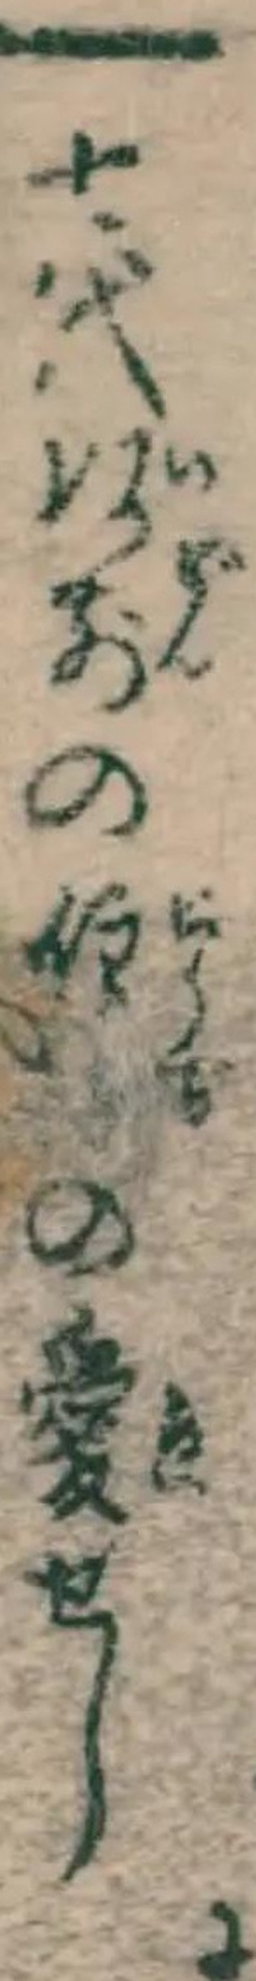七代以前の住持の愛せし
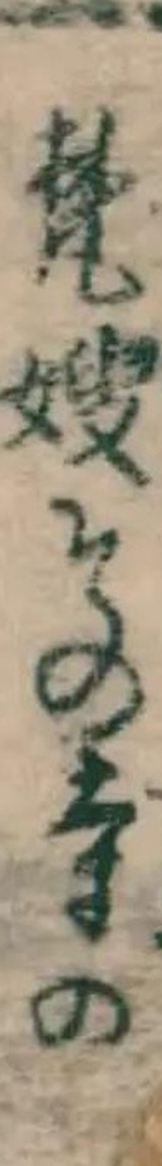梵嫂その寺の
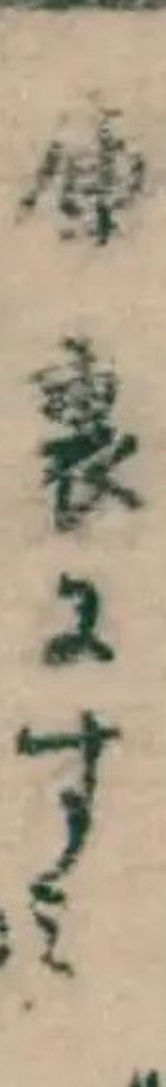庫裏にすみ
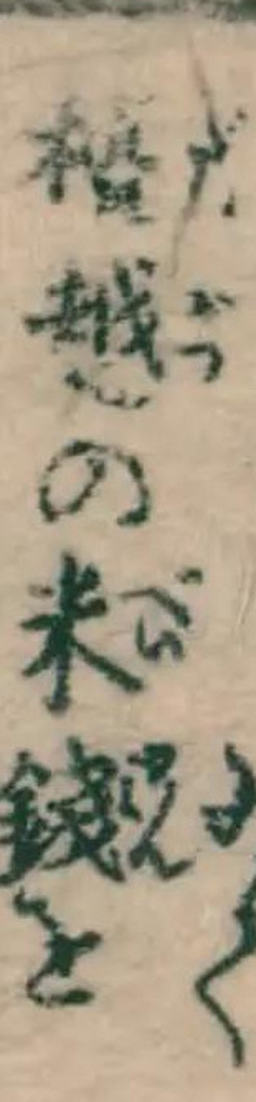檀越の米銭を
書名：百鬼夜行 3巻拾遺3巻. [2]
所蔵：国立国会図書館 National Diet Library, JAPAN
